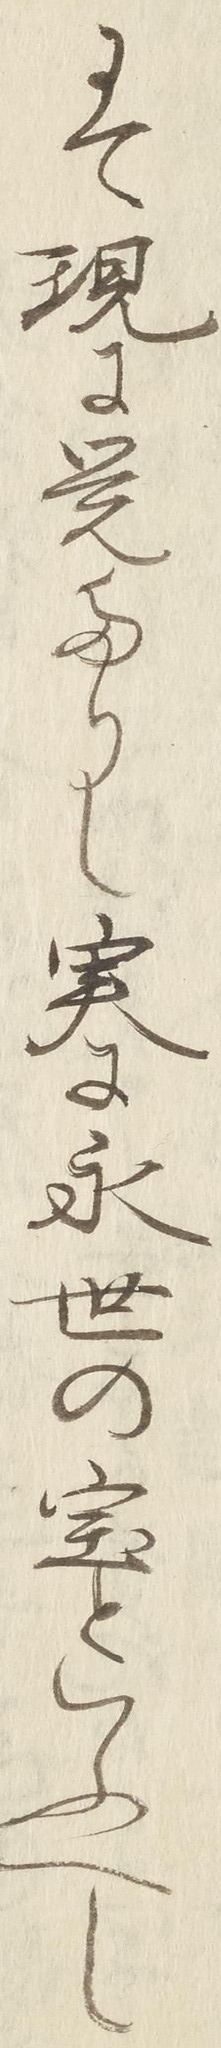にて現に覚たりし実に永世の宝といふへし
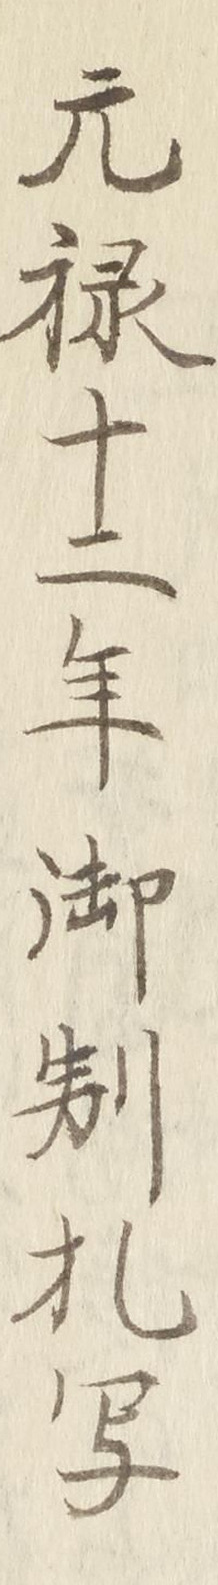元禄十ニ年御制札写
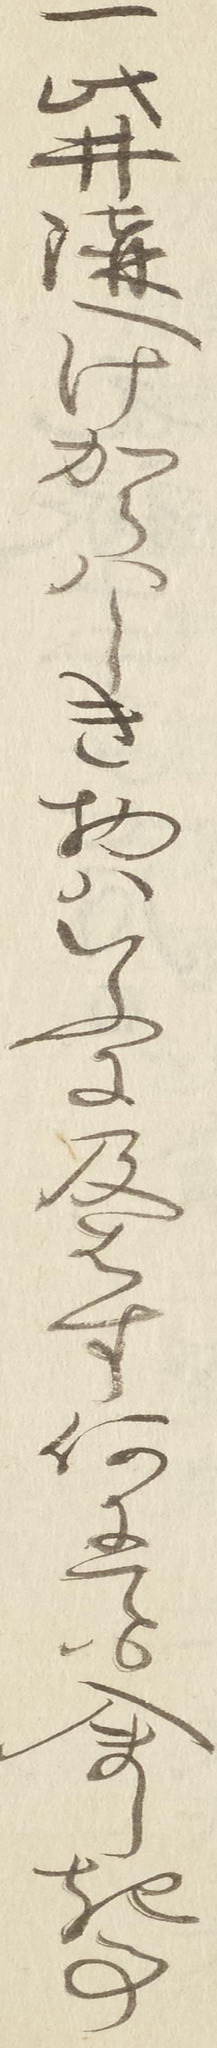一此井溝へけからはしき物はいふに及はす何にても入ましき事
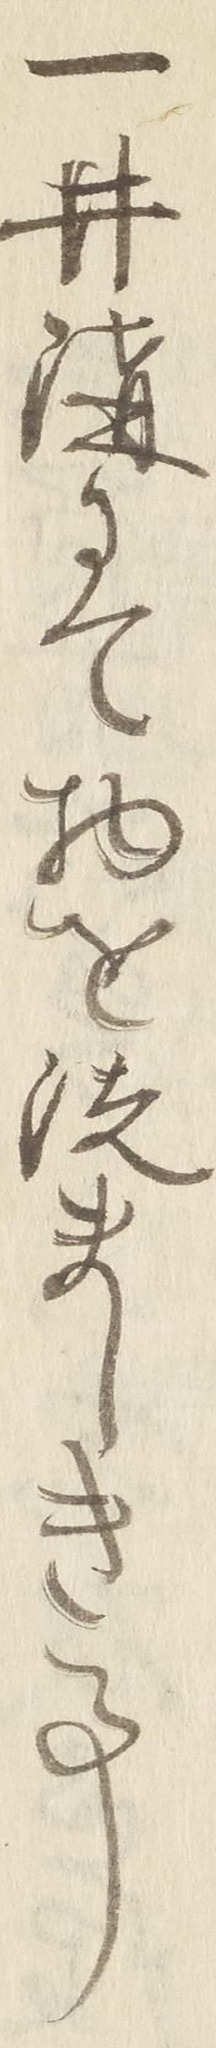一井溝にて物を洗ましき事
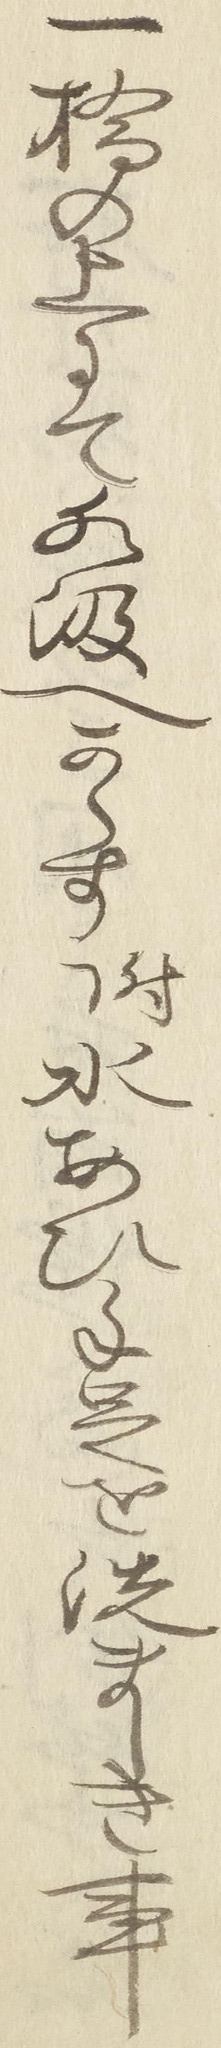一橋の上にて水汲へからす附水あひ手足を洗ましき事

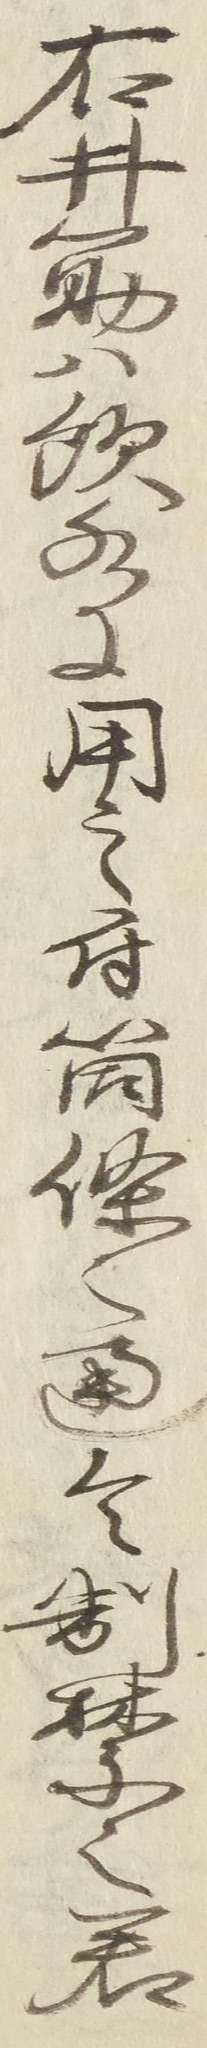右井筋は飲水に用之に付箇条の通今制禁也若
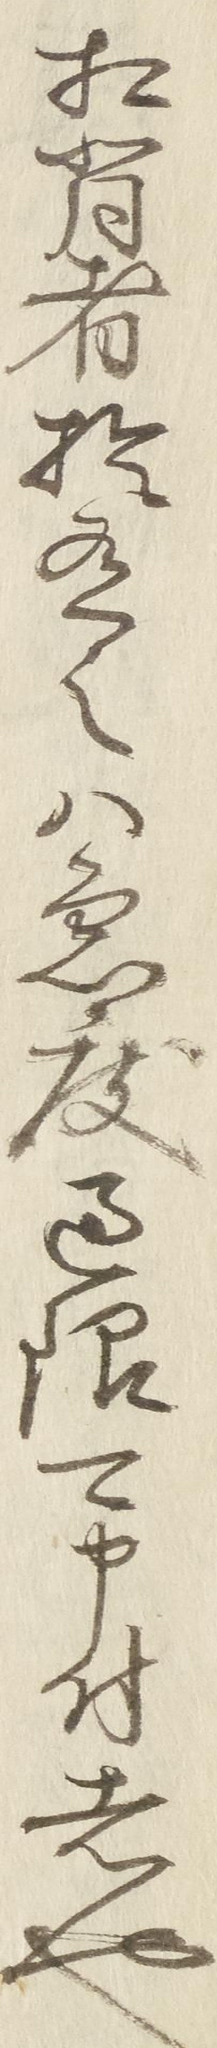相背者於有之は急度過銀可申付者也
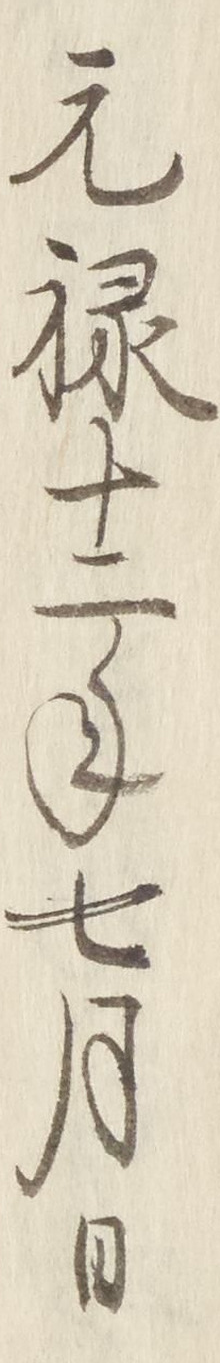元禄十二年七月日
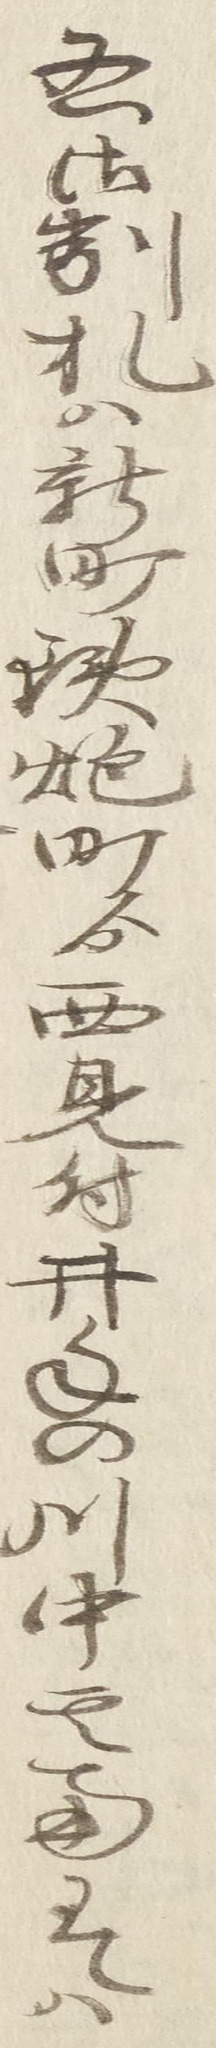右御制札は新町鉄炮町より西見付井手の川中其南にては
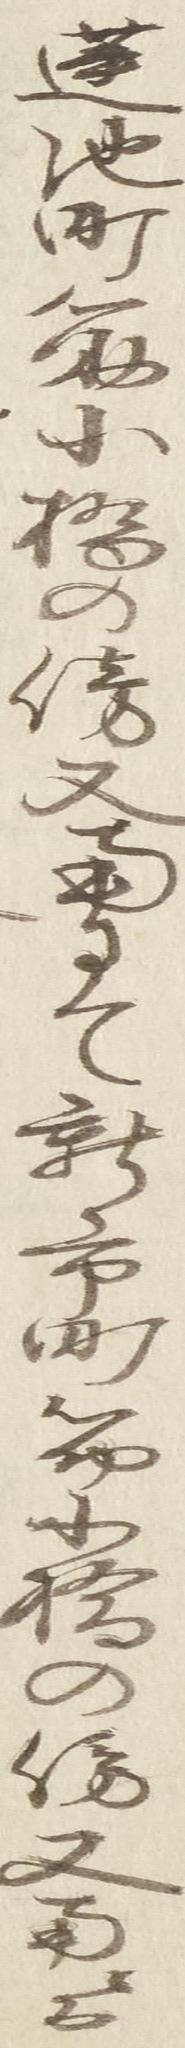蓮池町筋小橋の傍又南にて新市町筋小橋の傍又南にて
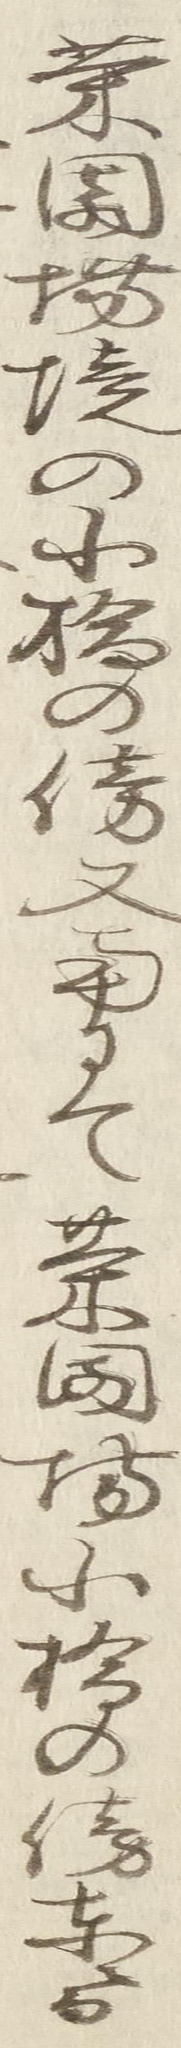菜園場境の小橋の傍又南にて菜園場小橋の傍東にて
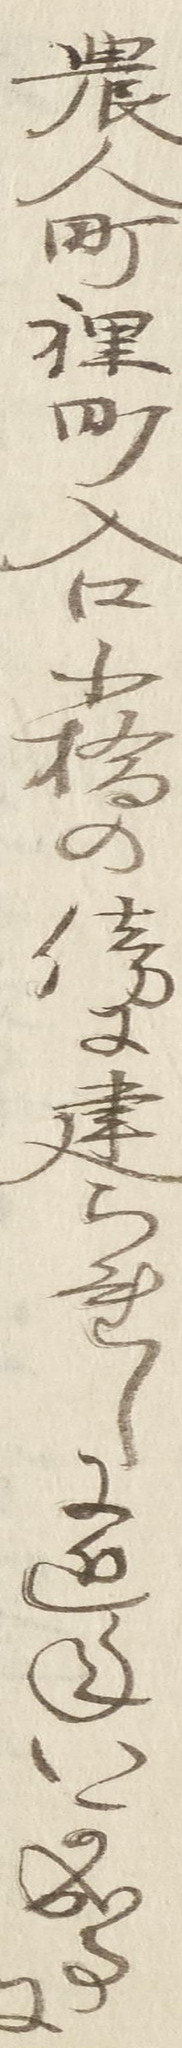農人町裡町入口小橋の傍に建られしに近年いか成事に
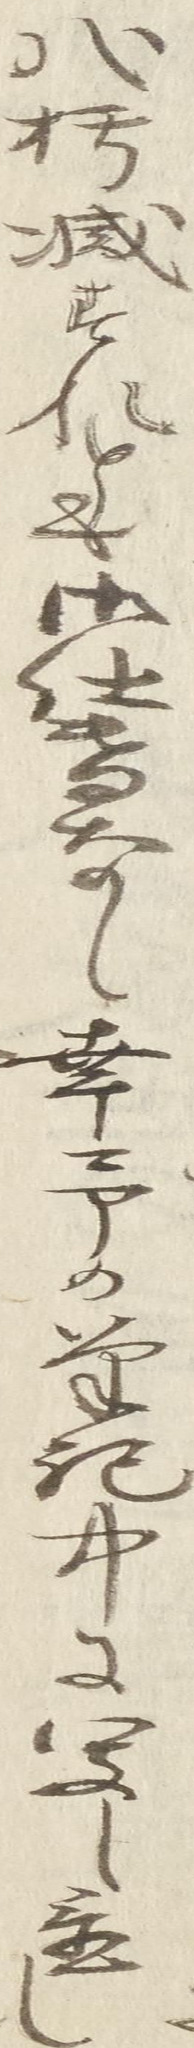心朽ち滅すれとも御仕替なし幸予の筆記中に写し置し
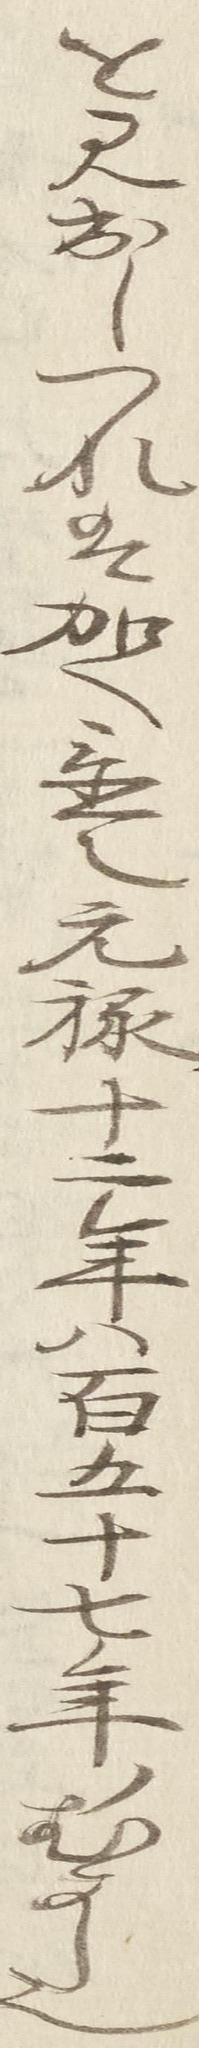を見出しつれは加へ置也元禄十二年は八百五十七年むかし也
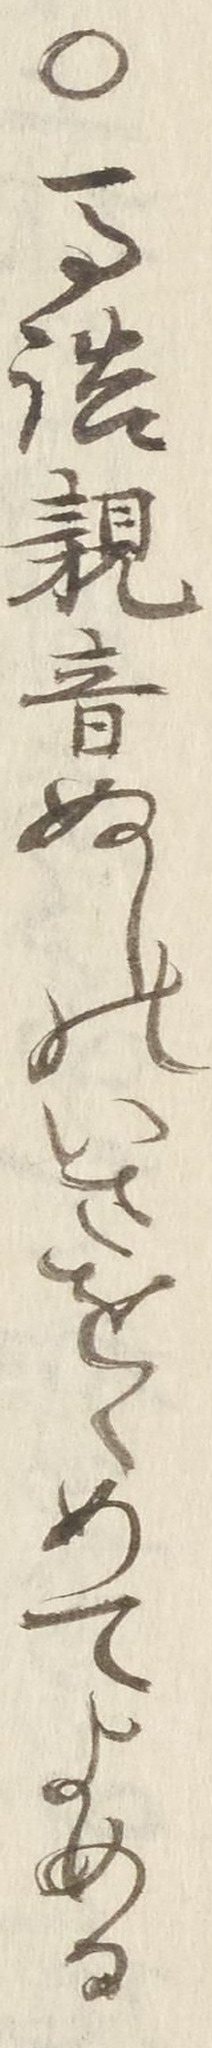〇馬詰親音ぬしのいさをゝめてよめる白頭翁
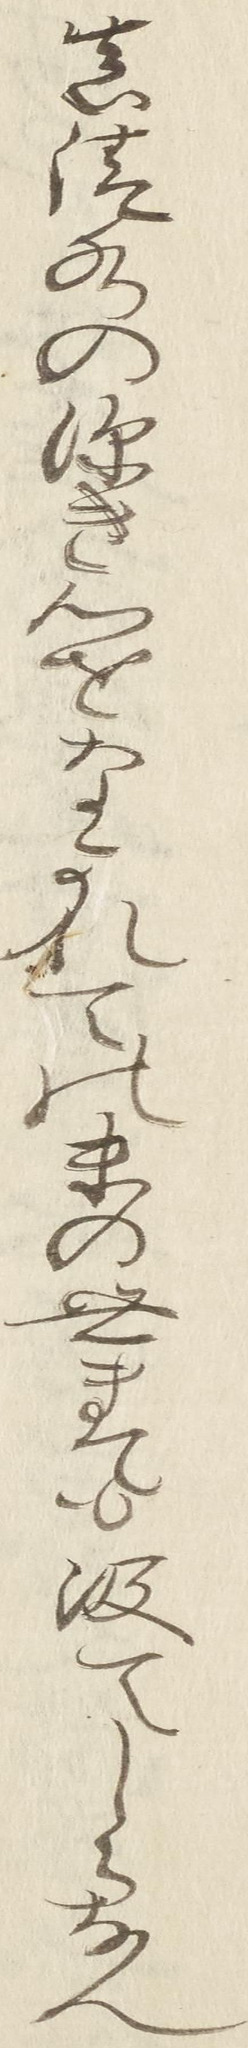真清水の深き心をなかれての末の世まても汲てしるなん
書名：地震記　上
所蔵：東京大学地震研究所図書室 Earthquake Research Institute Library, The University of Tokyo, JAPAN
